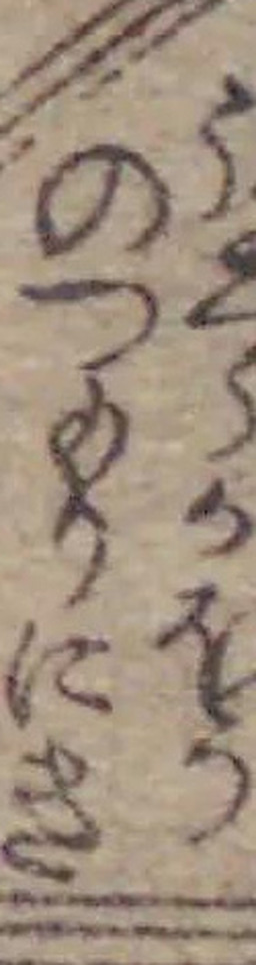のつもりにき
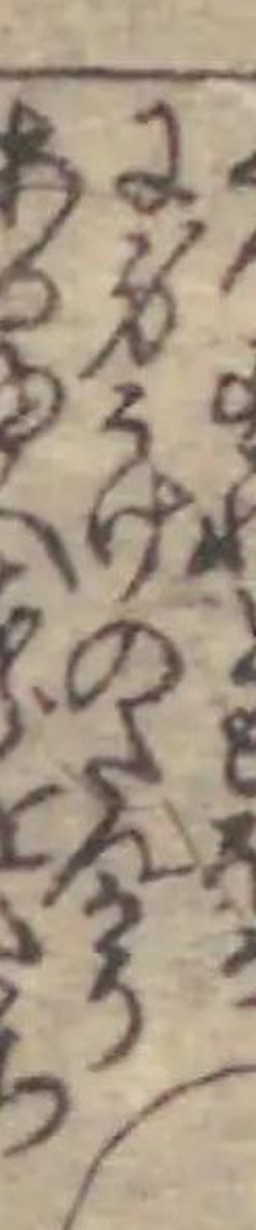あるゆへはらをたち
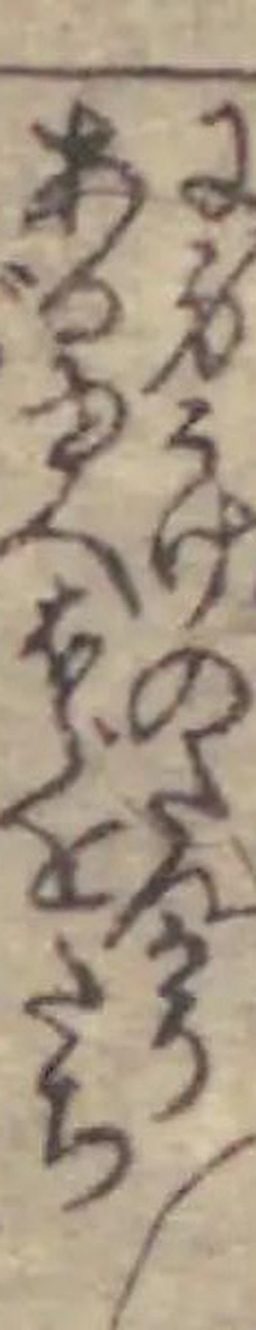あるゆへはらをたち
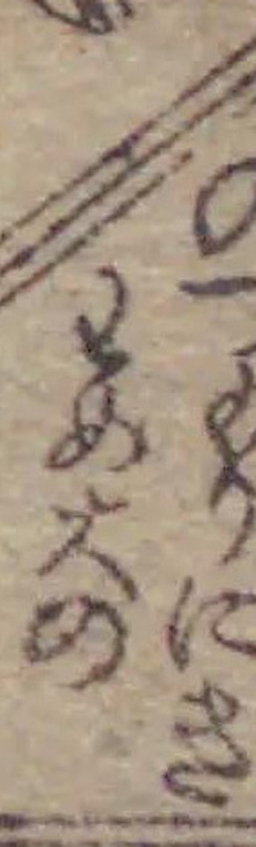わめ大の
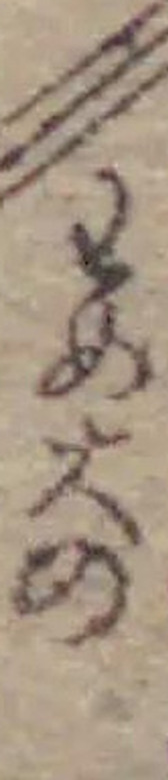わめ大の
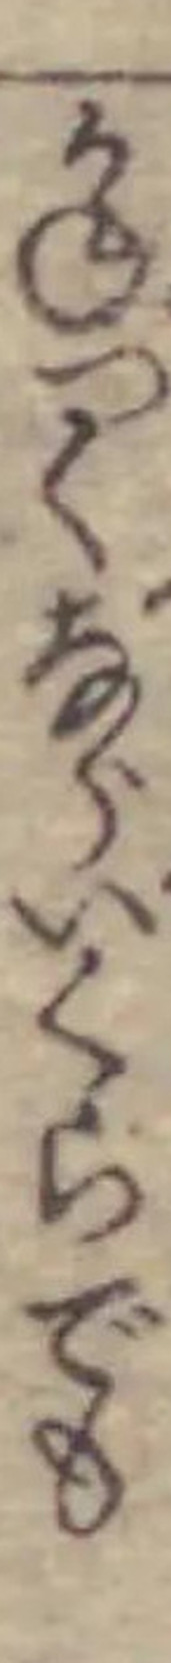かねづくならいくらでも
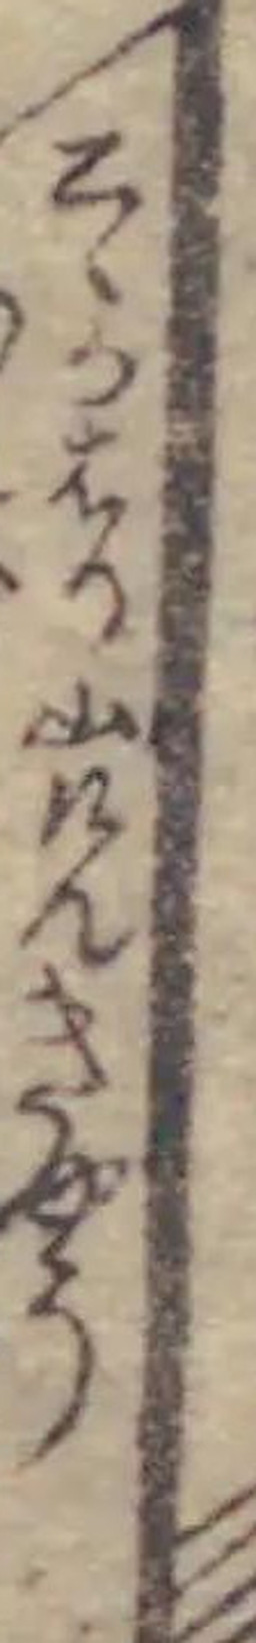こゝろはり山けんきやう
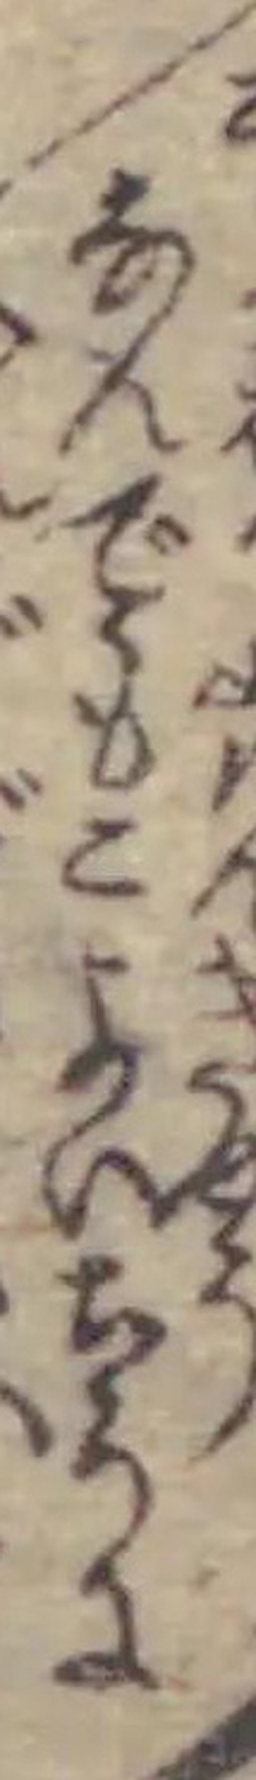なんでもこよいちうに
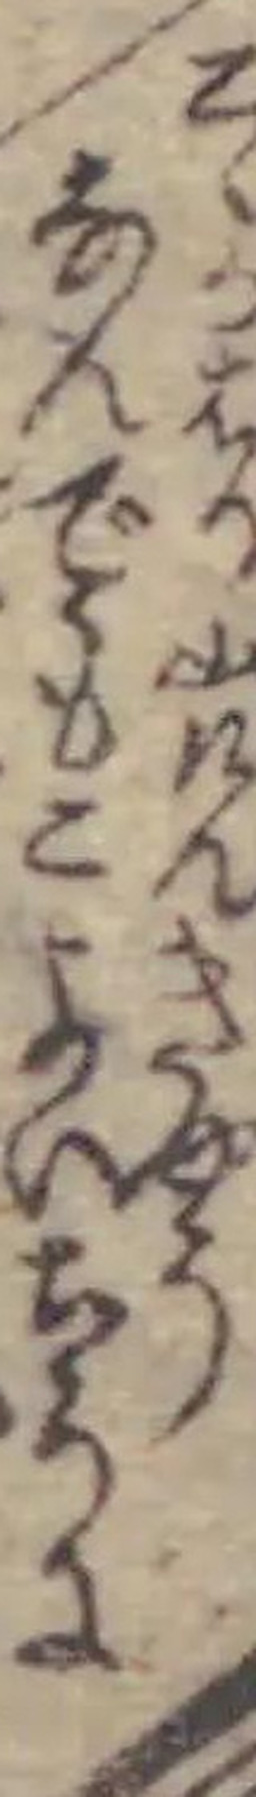なんでもこよいちうに
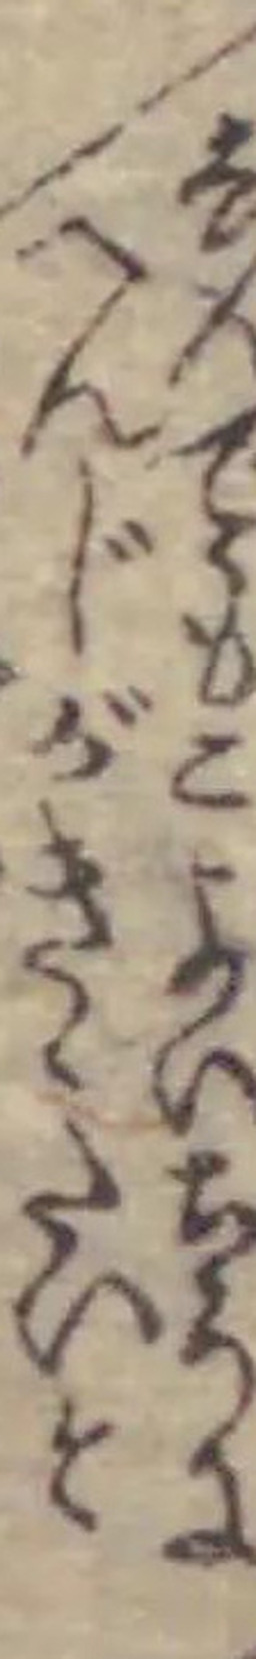へんじがきゝたいと
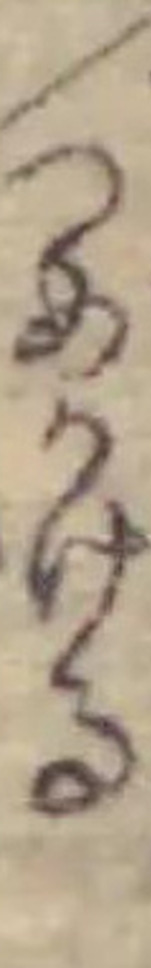つめかける
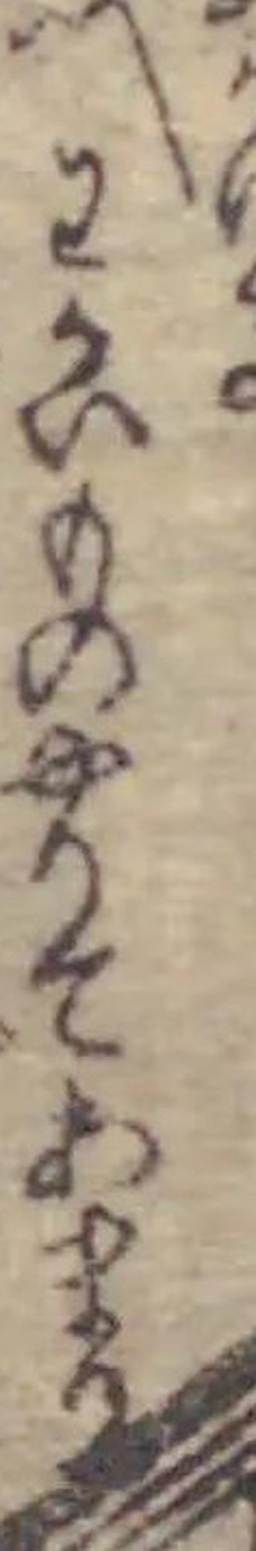「わかいものやりてあまり
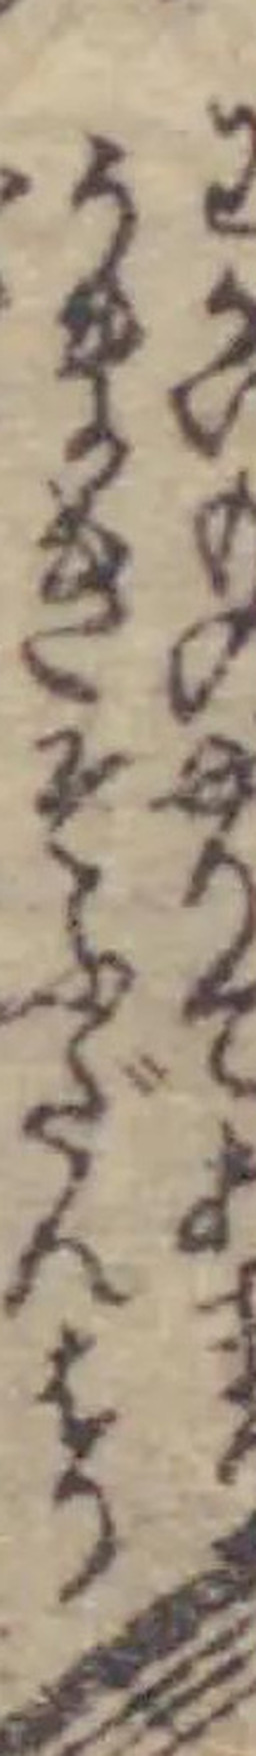うまきそふだんはり
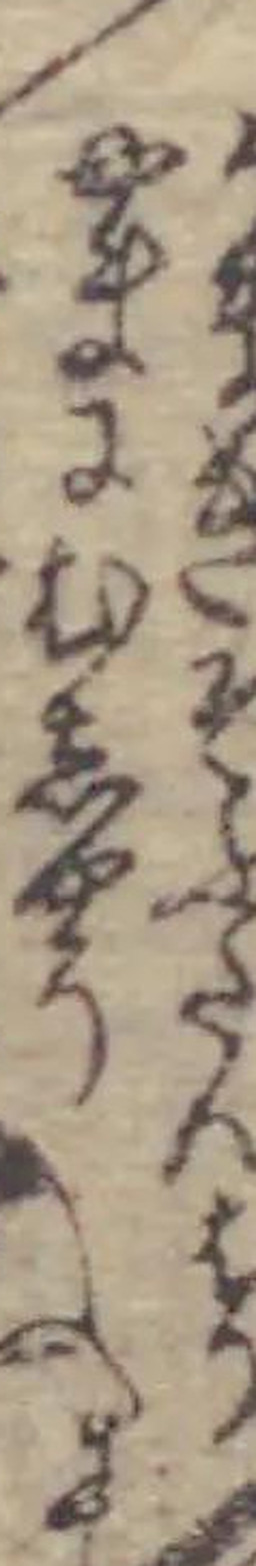やまにむしやう
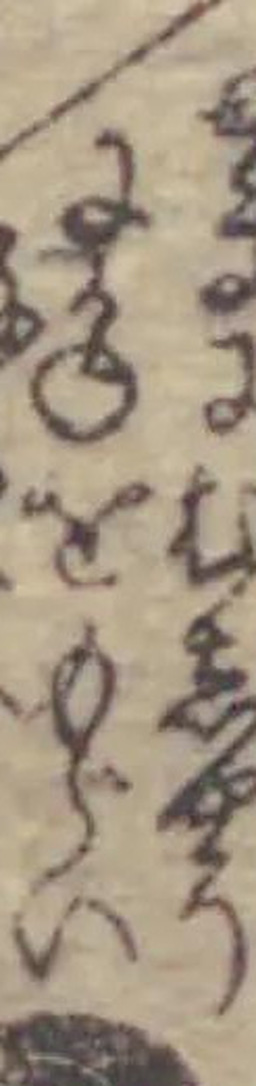にかねをもらい
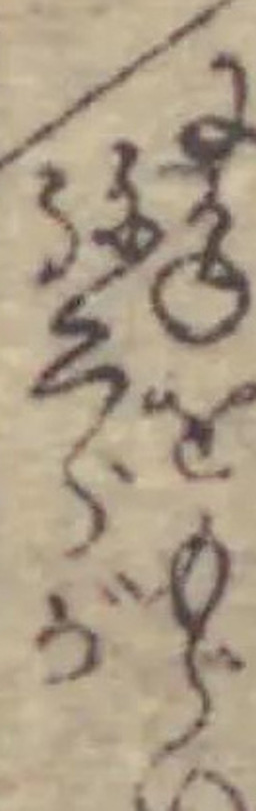弥二郎が
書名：虚言弥二郎傾城誠 3巻
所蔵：国立国会図書館 National Diet Library, JAPAN
